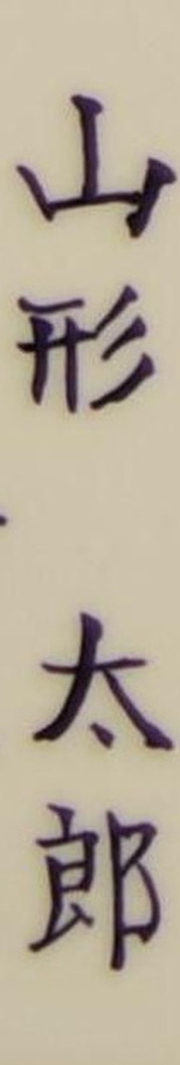山形太郎
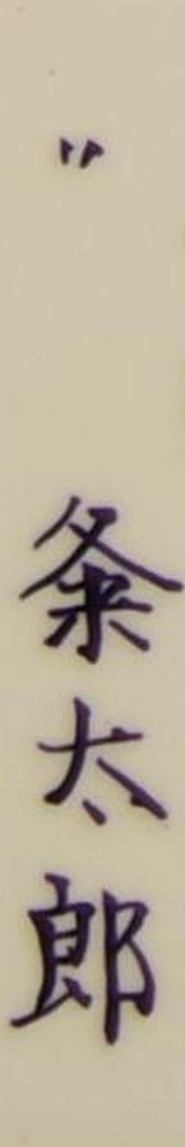粂太郎
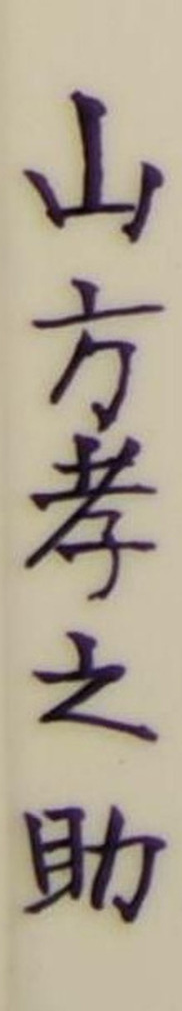山方孝之助

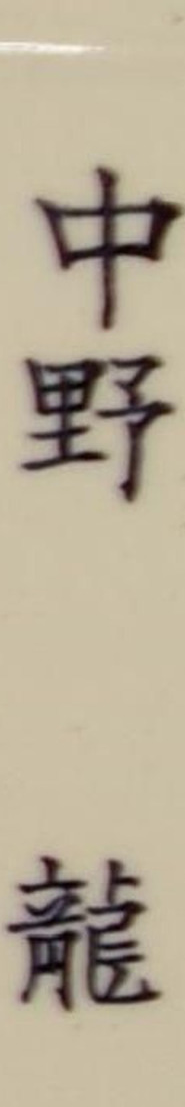中野龍
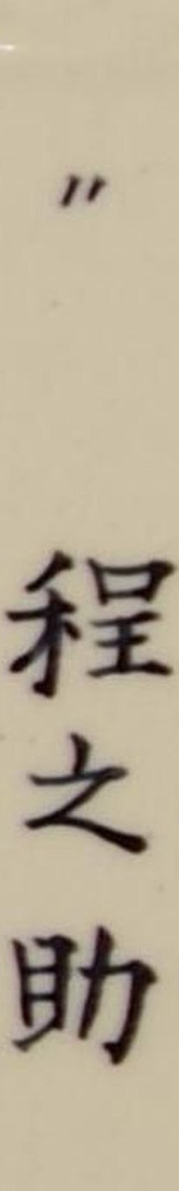程之助
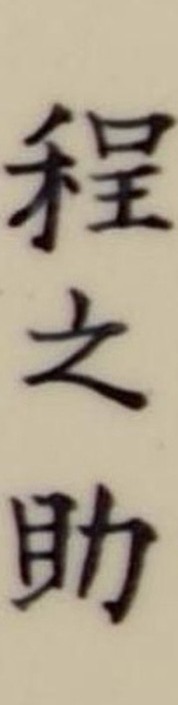程之助
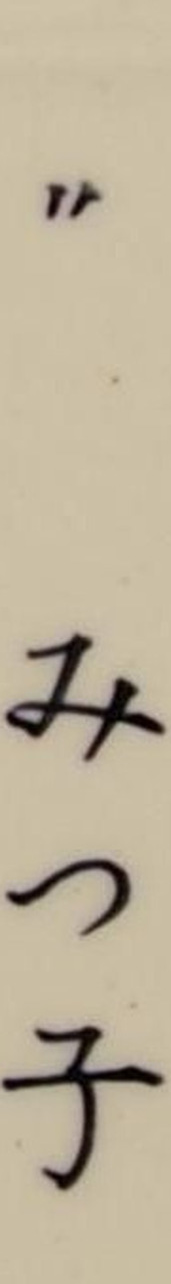みつ子
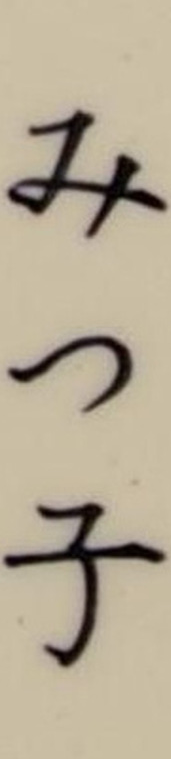みつ子
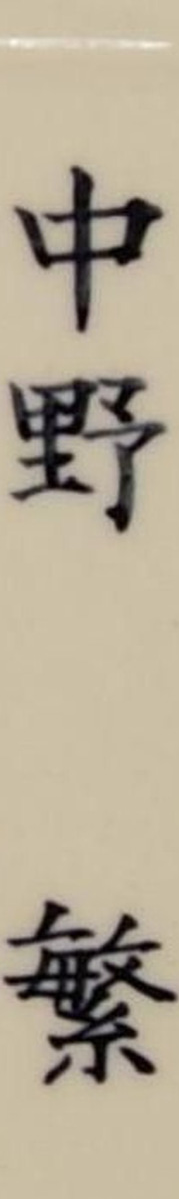中野繁
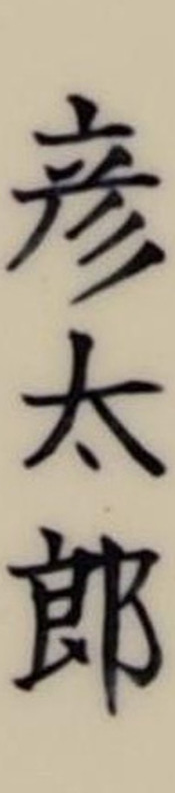彦太郎
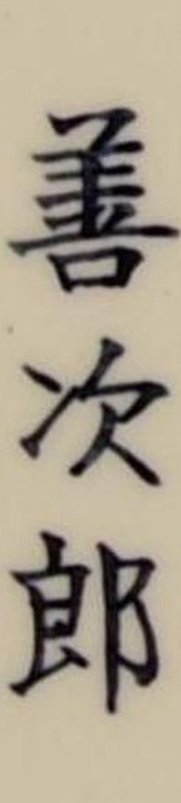善次郎
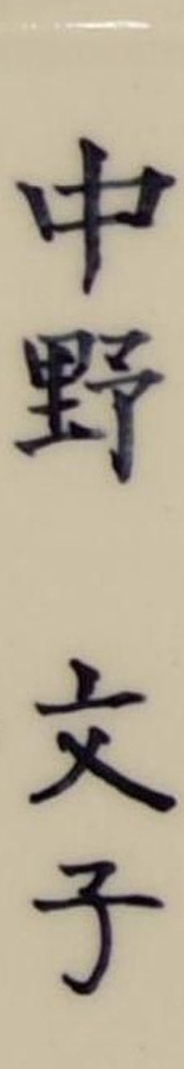中野文子

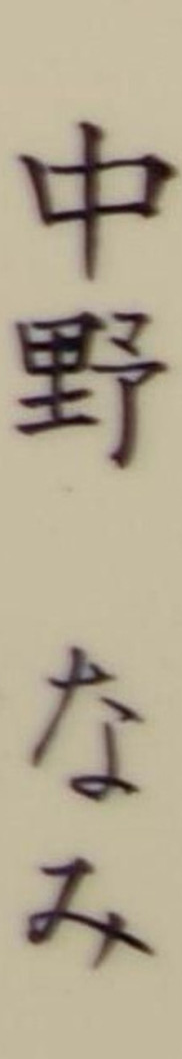中野なみ
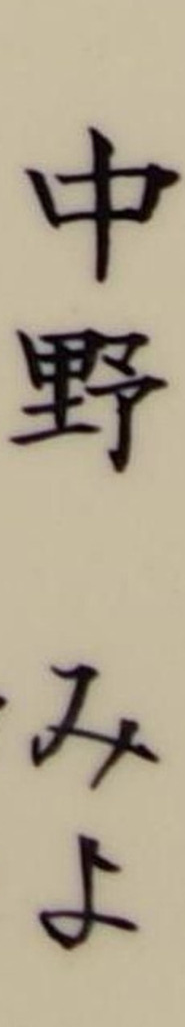中野みよ
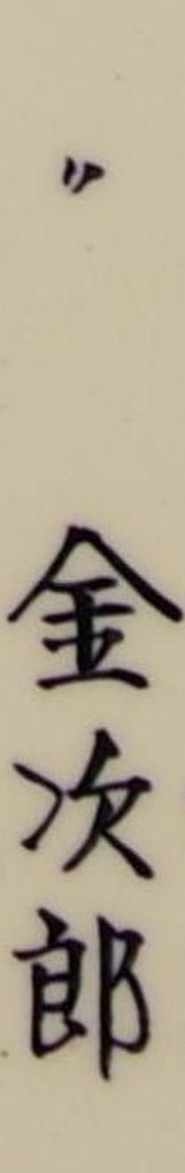金次郎
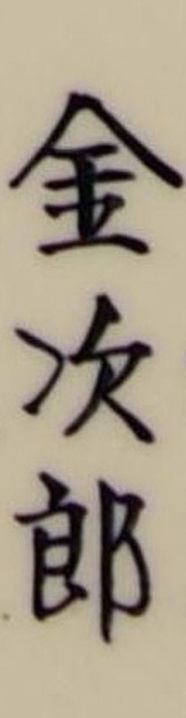金次郎
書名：A~D
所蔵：koyasan kongobuji
